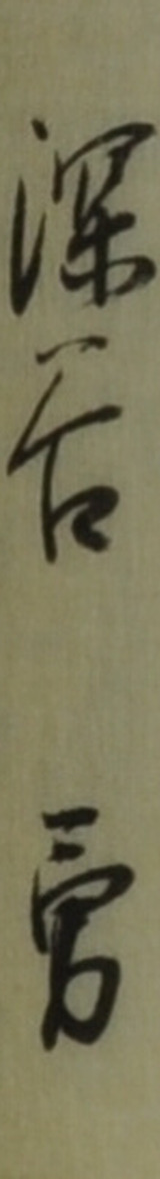深谷勇
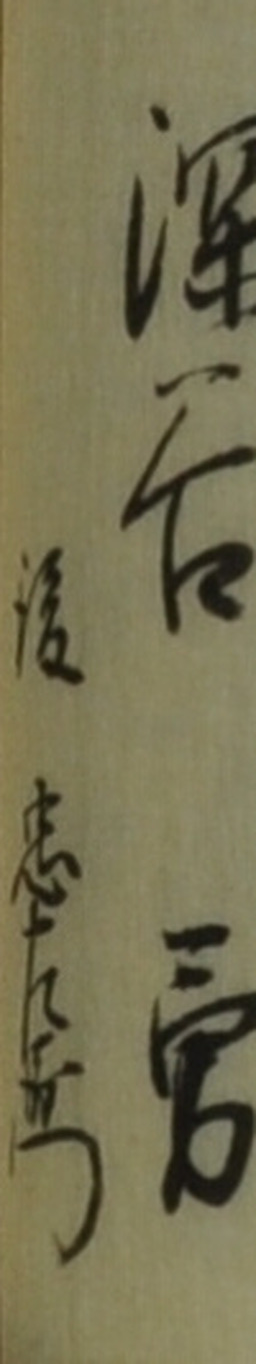後忠左衛門
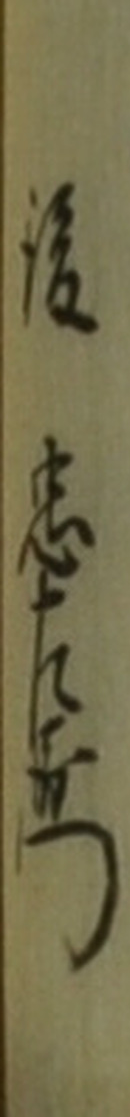後忠左衛門
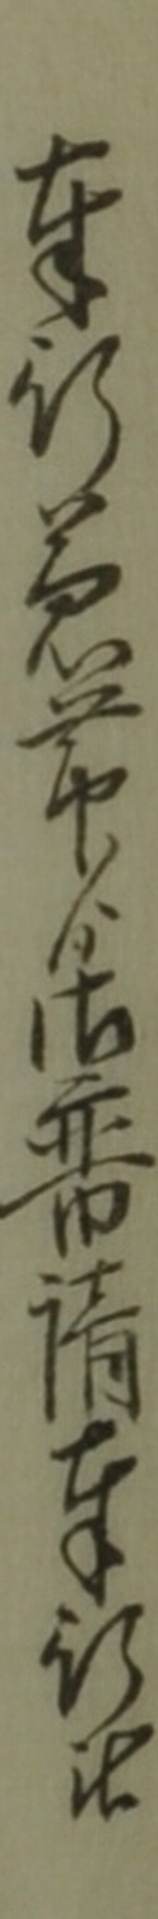奉行兼帯ゟ御普請奉行被
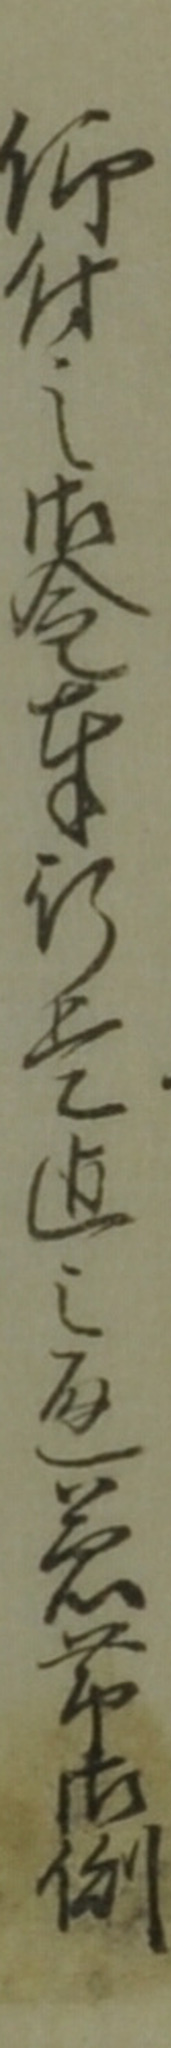仰付之御金奉行是迄之通兼帯御側
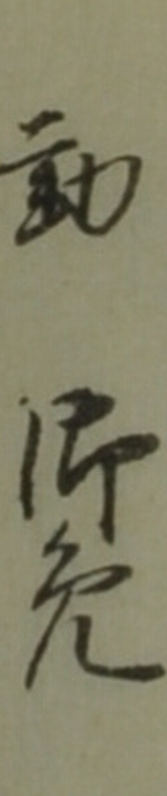勤御免
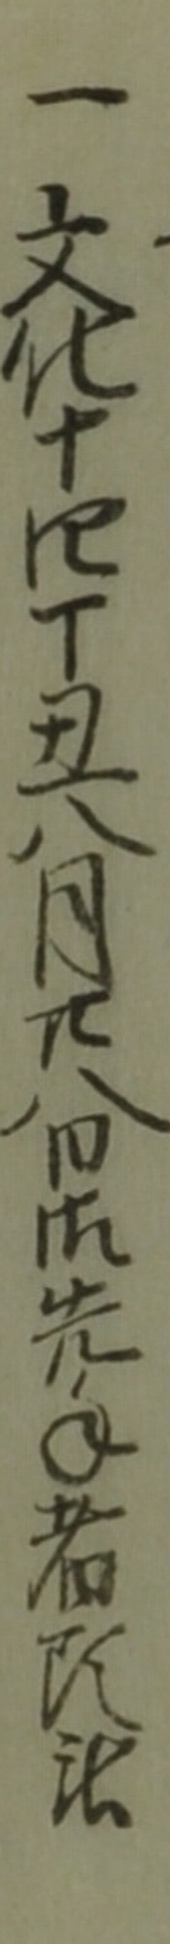一文化十四丁丑八月廿八日御先手者頭被
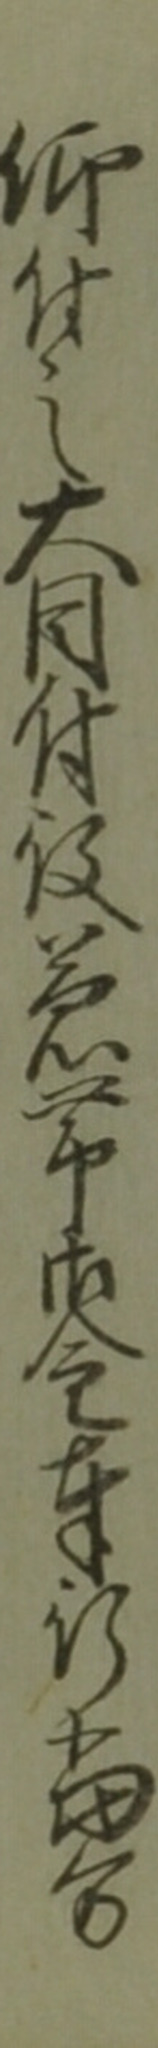仰付之大目付役兼帯御金奉行当分
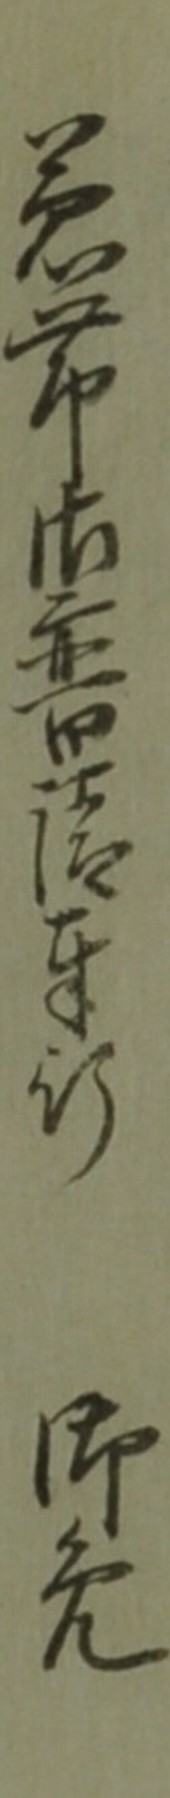兼帯御普請奉行御免
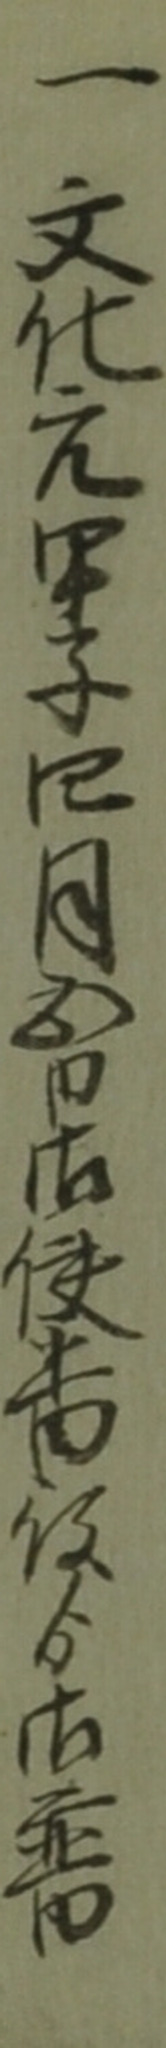一文化元甲子四月五日御使番役ゟ御普
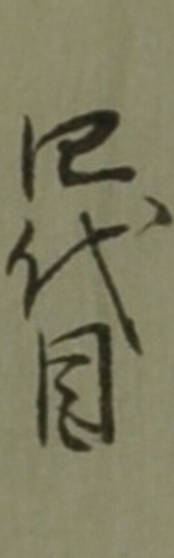四代目
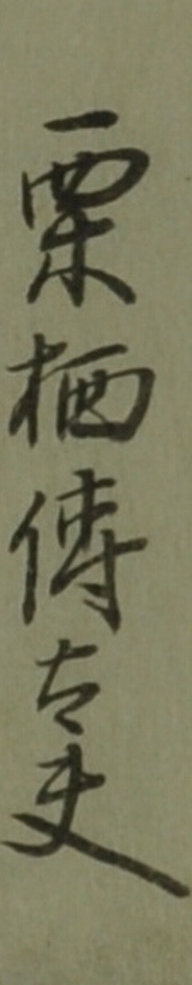栗栖伝太夫
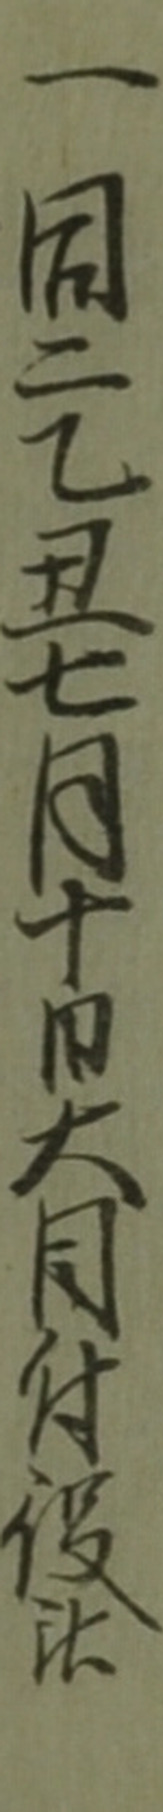一同二乙丑七月十日大目付役被
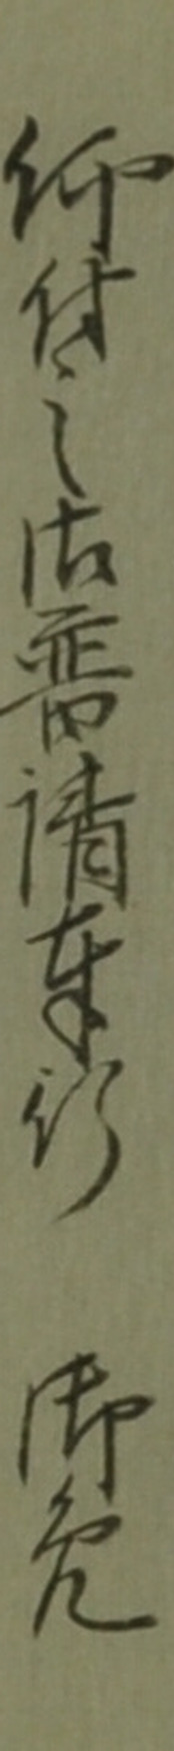仰付之御普請奉行御免
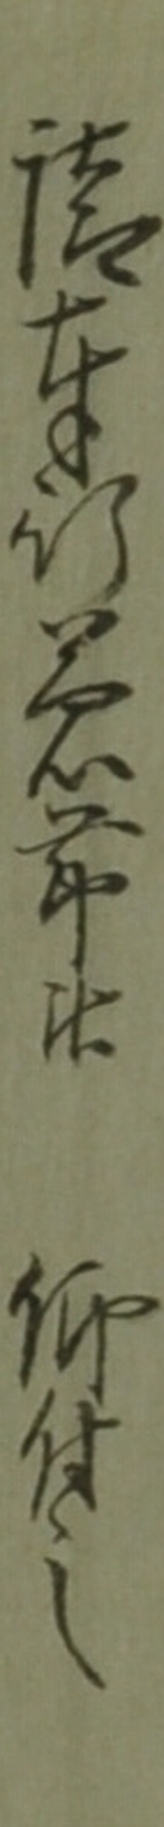請奉行兼帯被仰付之
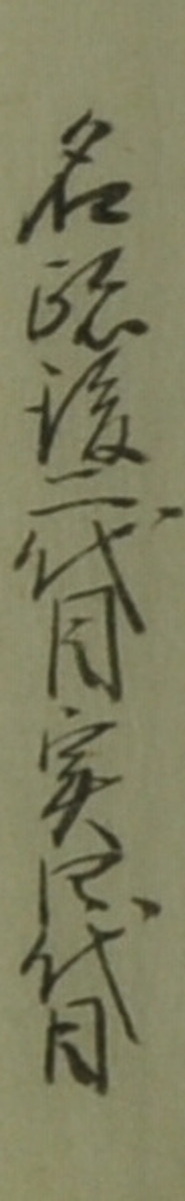名跡後二代目実四代目
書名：諸御役代々録（六）
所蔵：伊那市立高遠町図書館・合同会社AMANE
